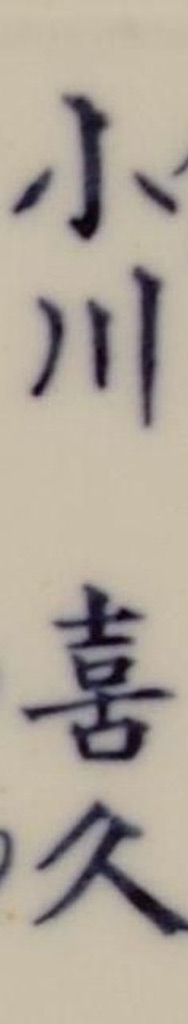小川喜久
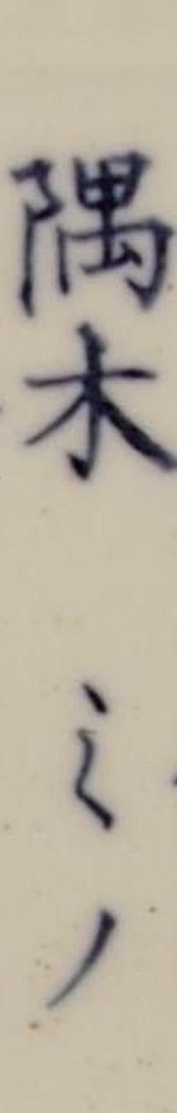隅木ミノ
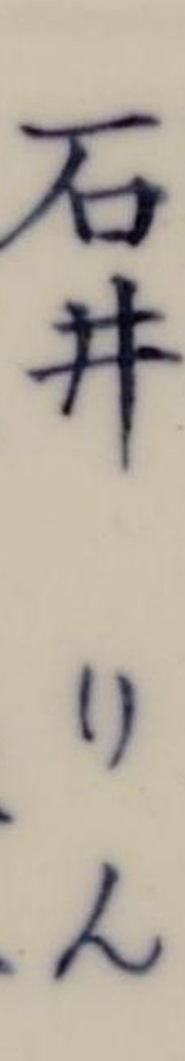石井りん
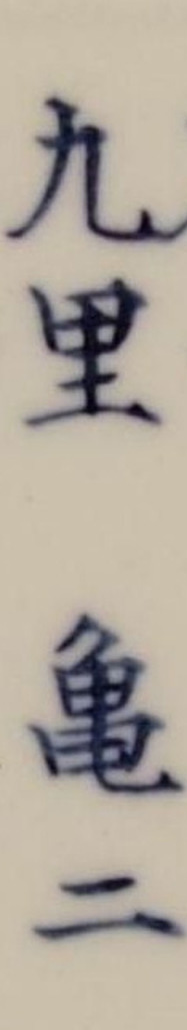九里亀二
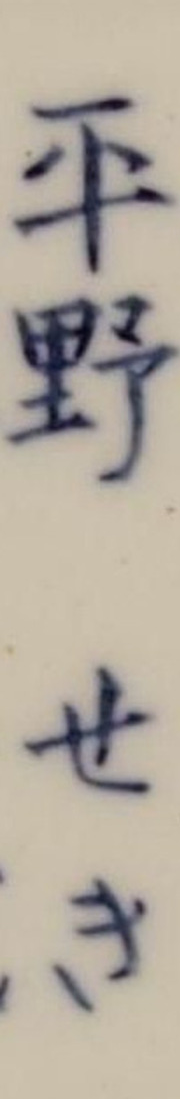平野せき
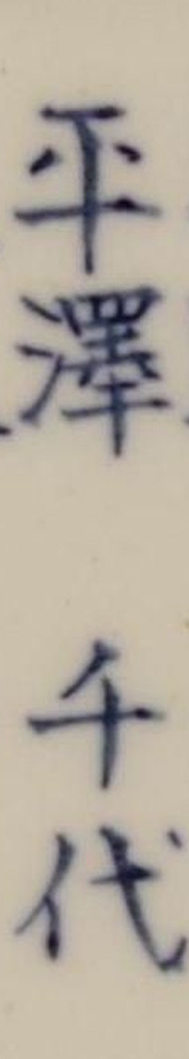平澤千代
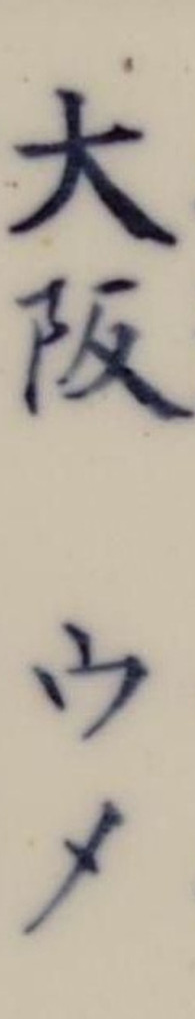大阪ウメ
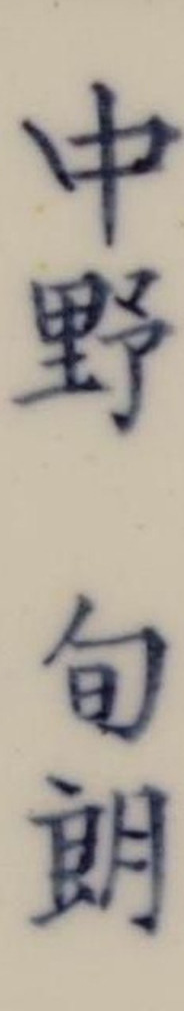中野旬朗
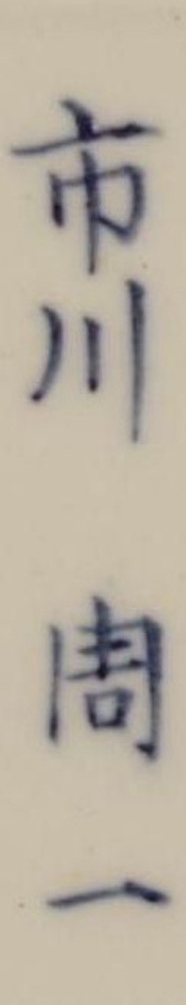市川周一
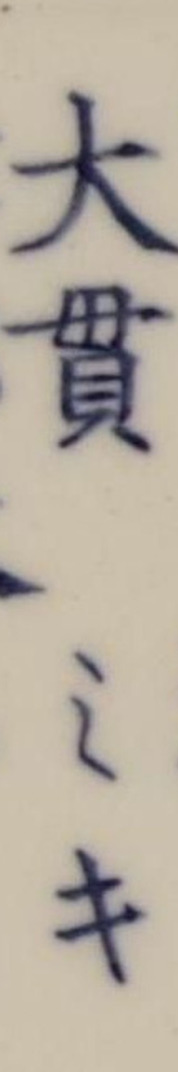大貫ミキ
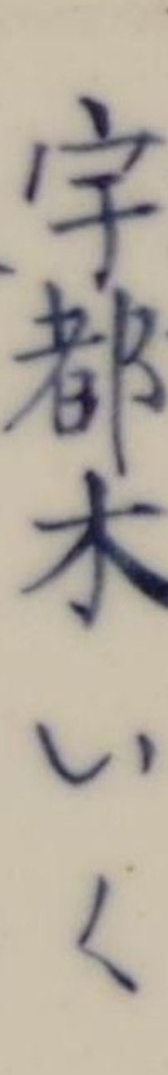宇都木いく
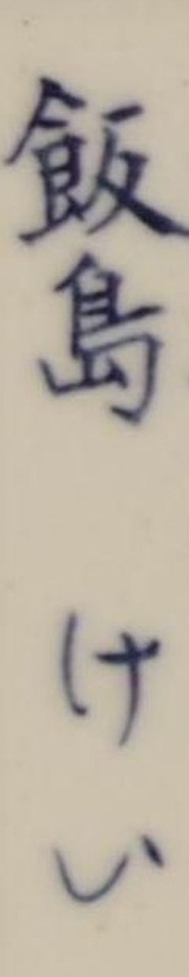飯島けい

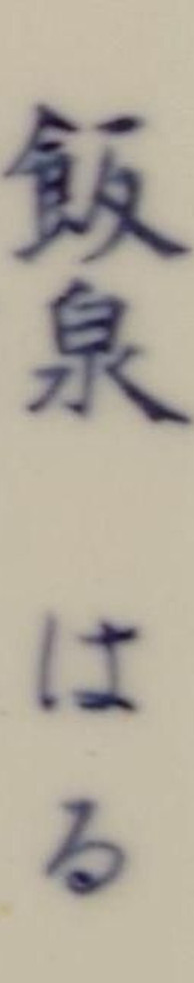飯泉はる
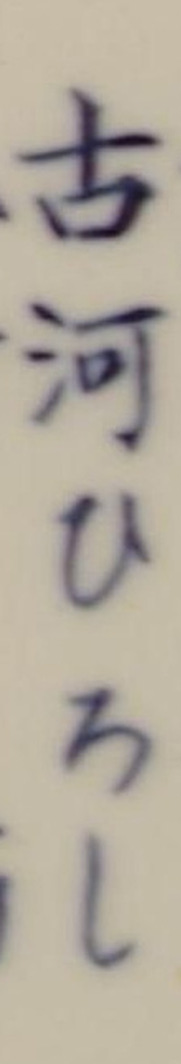古河ひろし
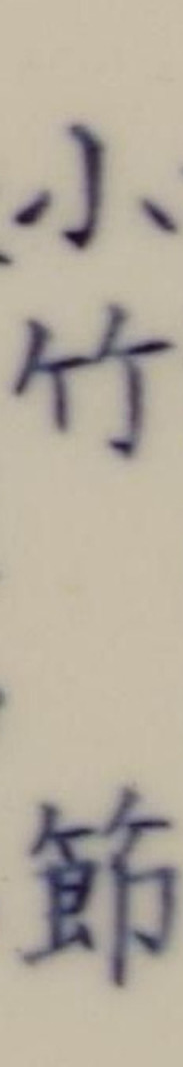小竹節
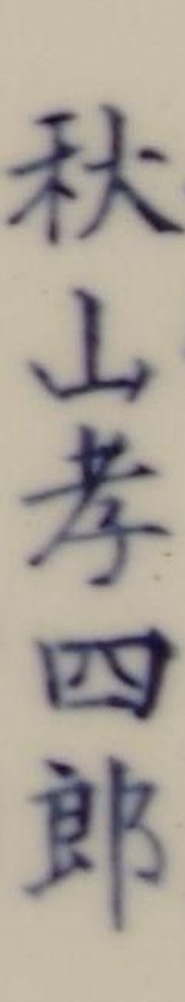秋山孝四郎
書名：E~L
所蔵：高野山金剛峯寺
